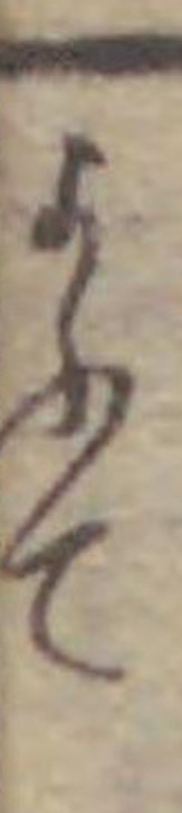よふて
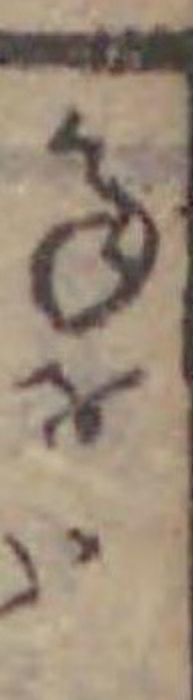かねを
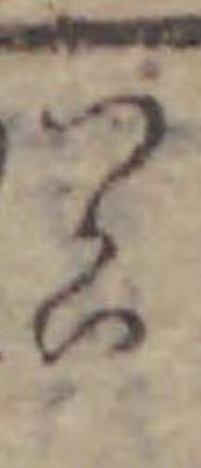つかい
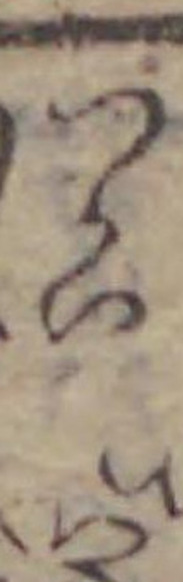つかい
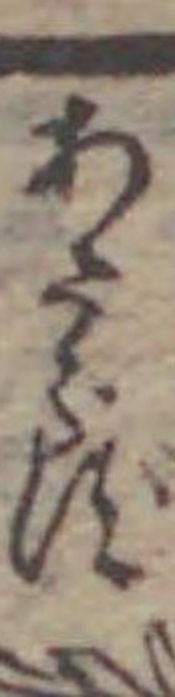あたらず
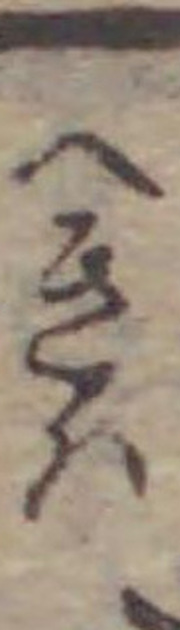へきは
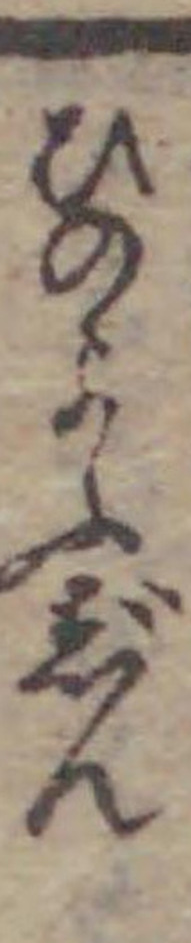ひのよふじん
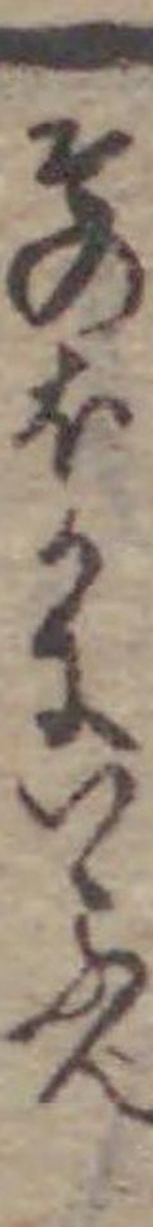そのほかにいゝふん
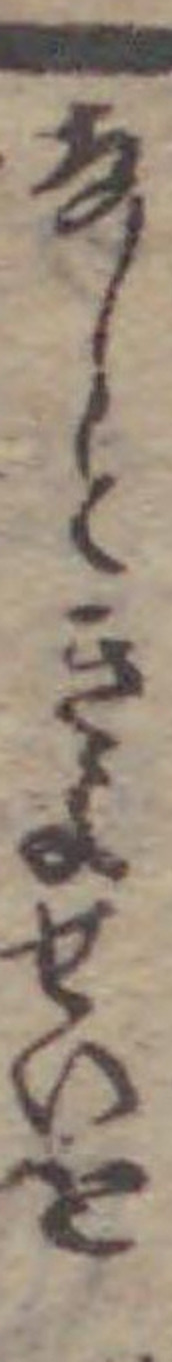なしときよせいを
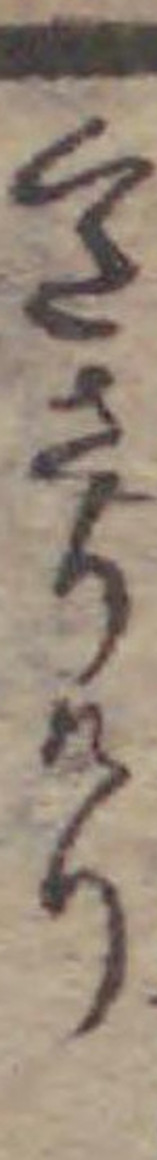くたさりけり
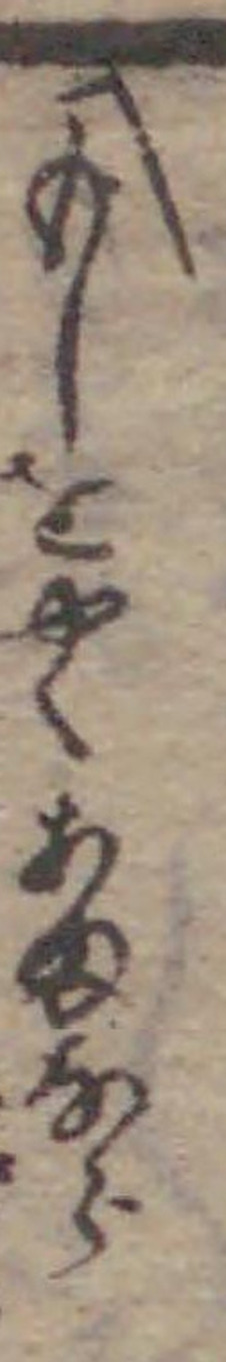〽もしをやくあまなら
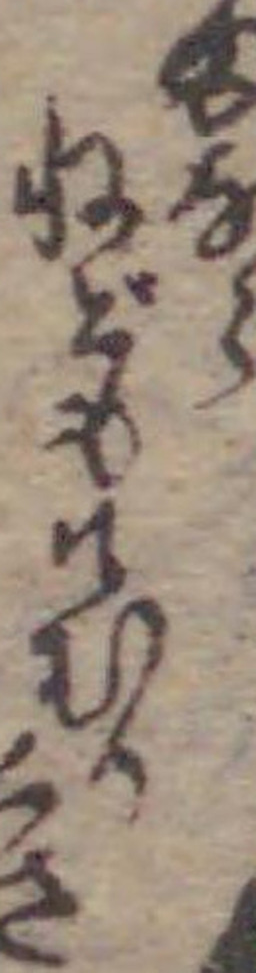ねどもけむりくさ
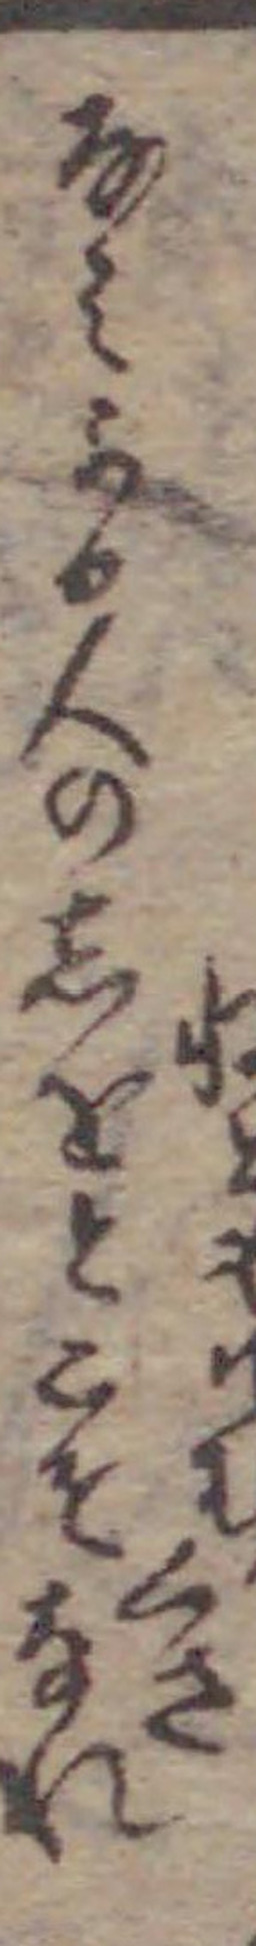なみよる人のしをとこそなれ
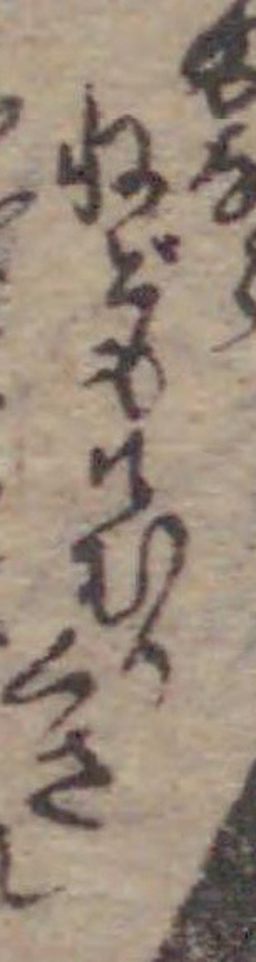ねどもけむりくさ
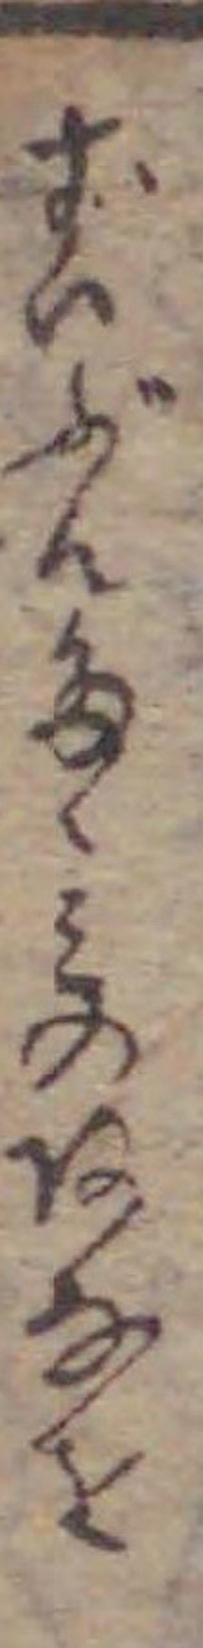ずいぶんたゝみのあなを
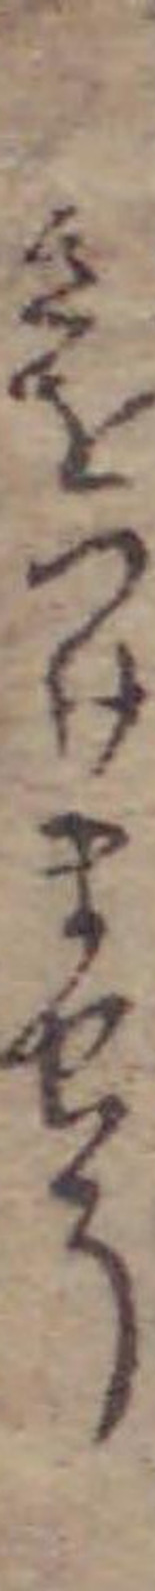きをつけませう
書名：談芭菰誉詞 : 3巻
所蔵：国立国会図書館 National Diet Library, JAPAN
